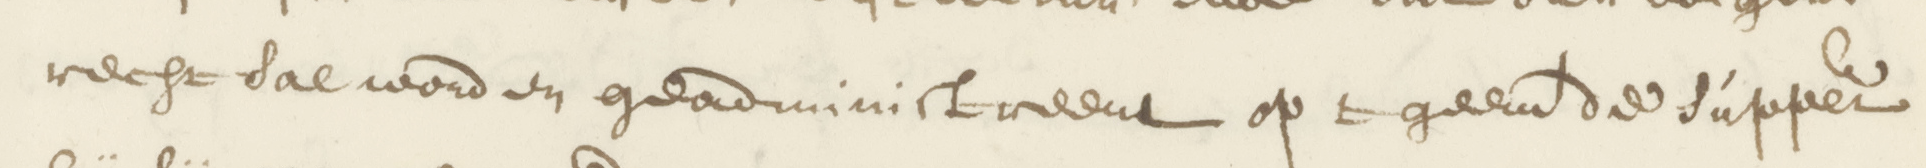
recht sal worden geadministreert op 't geen de supplt
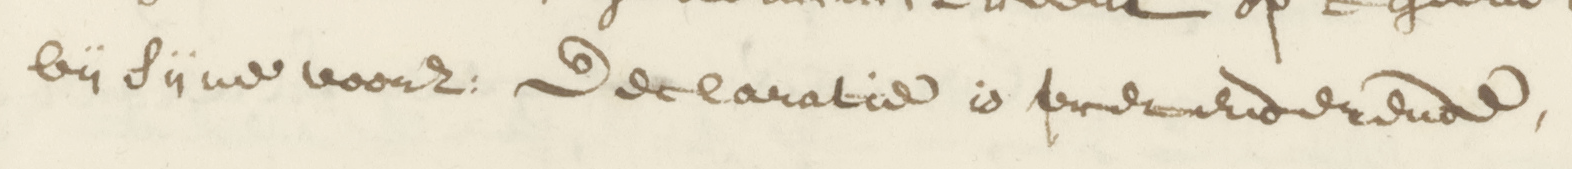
bij sijne voorz: Declaratie is pretenderende.
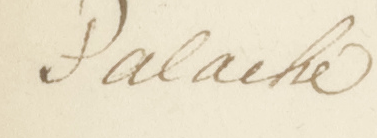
Palache
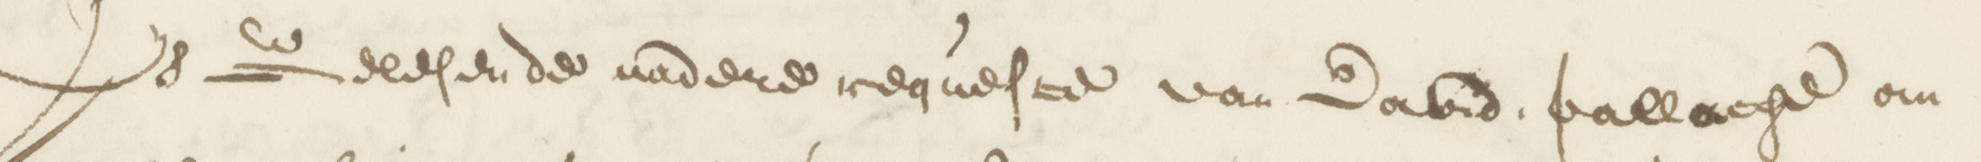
Is Gelesen de nadere requeste van David Pallache om
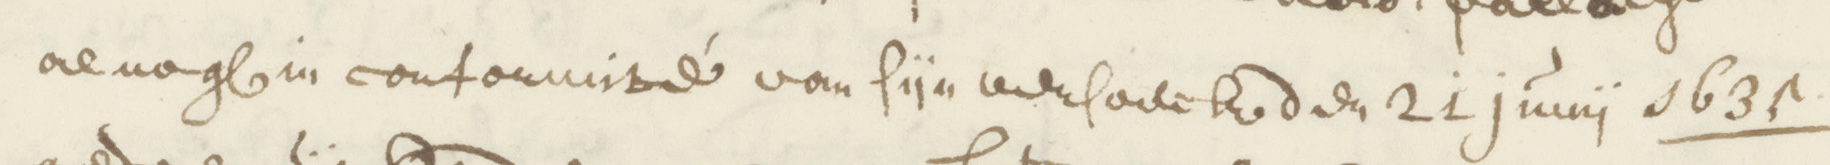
alnogh in conformité van sijn versoeck den 21 junij 1635
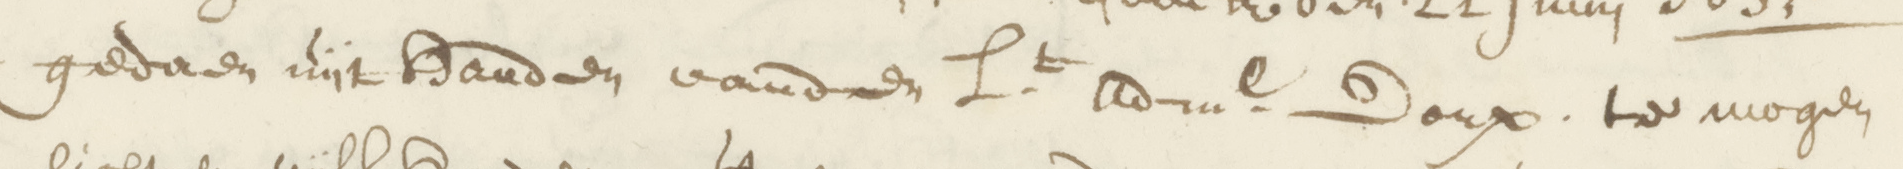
gedaen uijt handen vanden Lt. Adml. Dorp te mogen
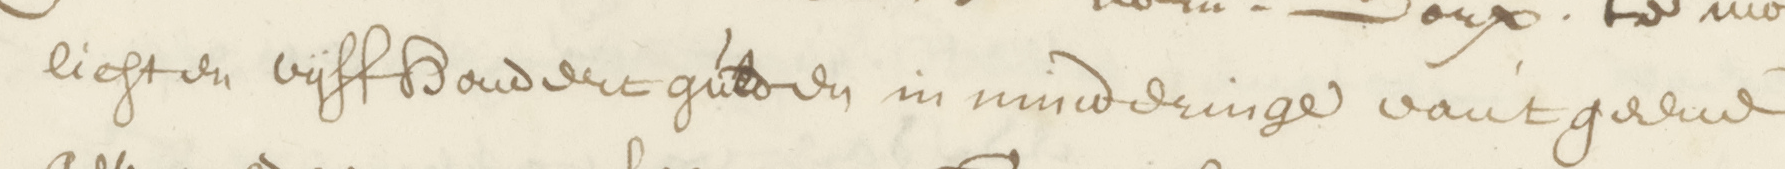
lichten vijffhondert gulden in minderinge van 't geene
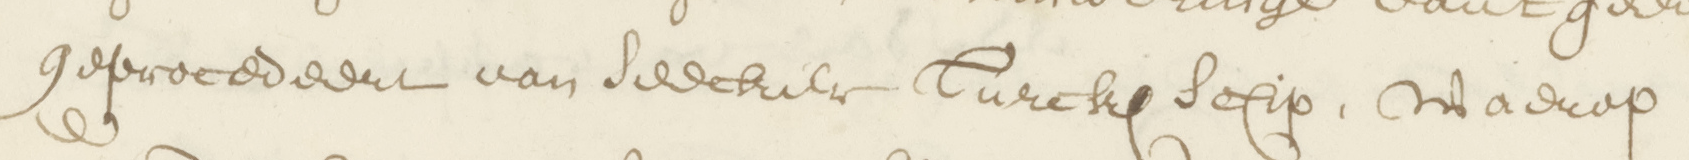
geprocedeert van seecker Turckx schip. Waerop
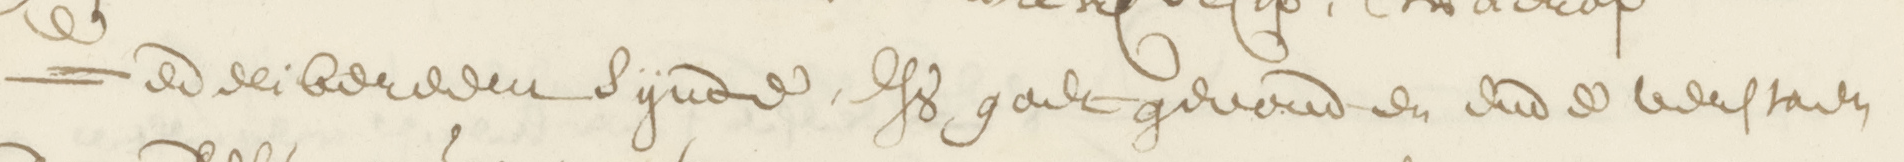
Gedelibereert sijnde, Is goet gevonden ende verstaen
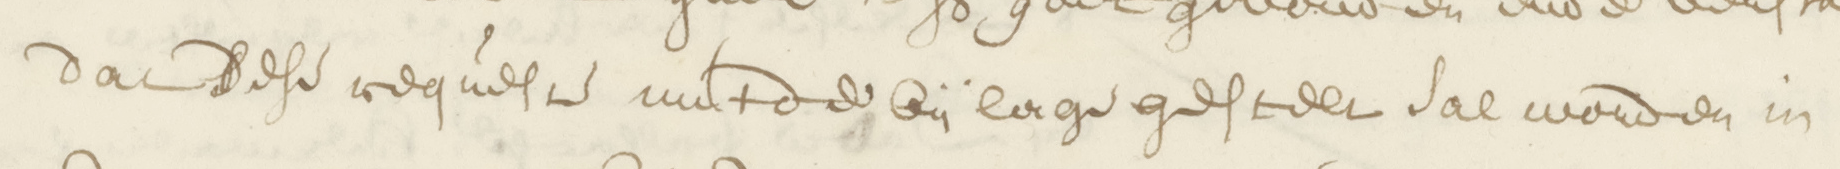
dat dese requeste met de bijlage gestelt sal worden in
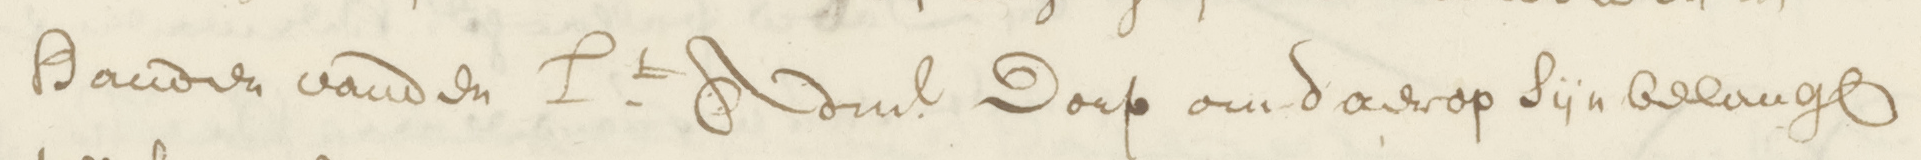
handen vanden Lt. Adml. Dorp om daerop sijn belangh
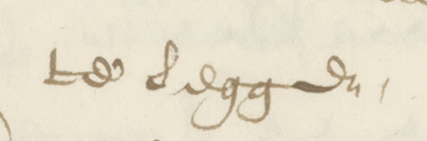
te seggen.
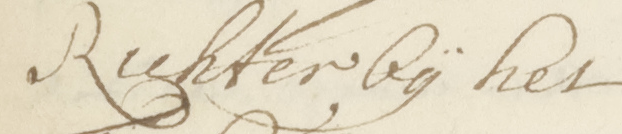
Richter bij het
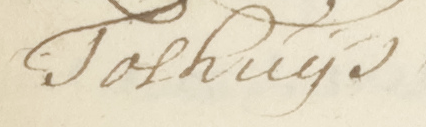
Tolhuijs
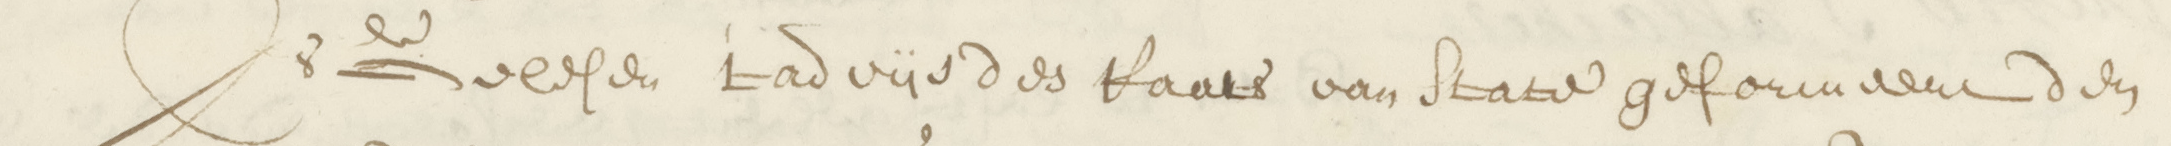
Is Gelesen 't advijs des Raats van State geformeert den
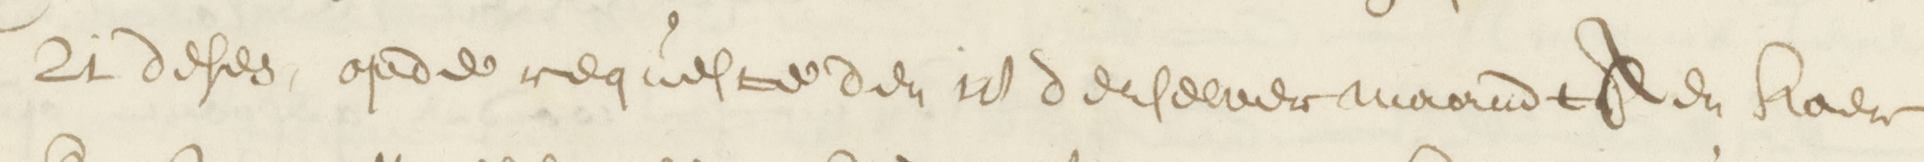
21 deses, opde requeste den 18 derselver maandt Aen haer
